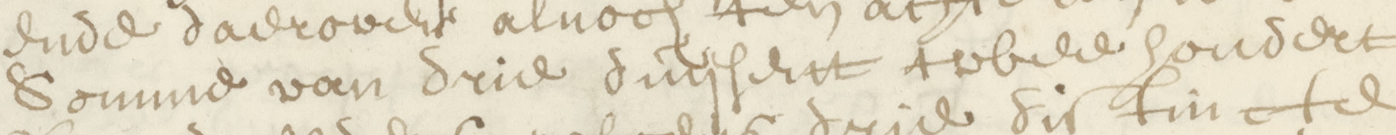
Somme van drie duijsent twee hondert
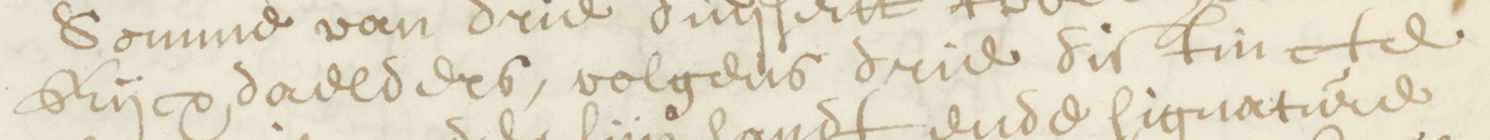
Rijcxdaelders, volgens drie distincte
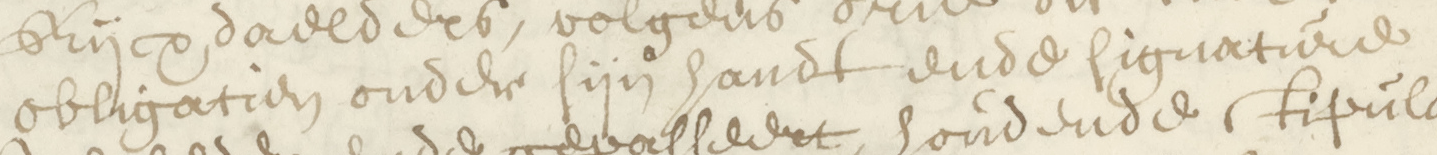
obligatien onder sijn handt ende signature
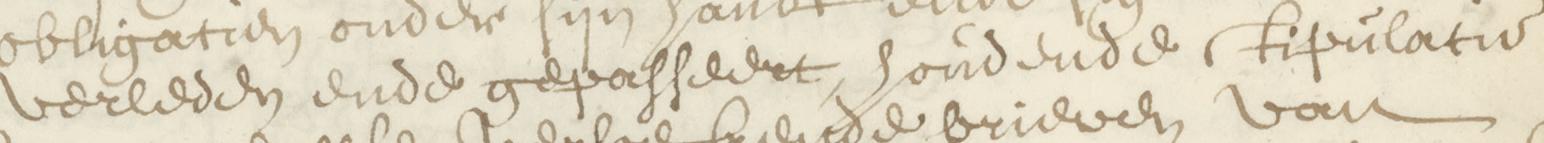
verleden ende gepasseert, houdende stipulatie
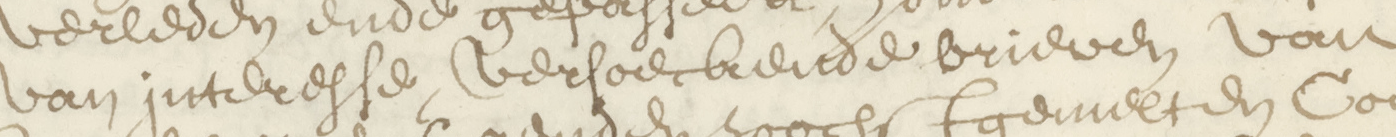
van interesse, versoeckende brieven van
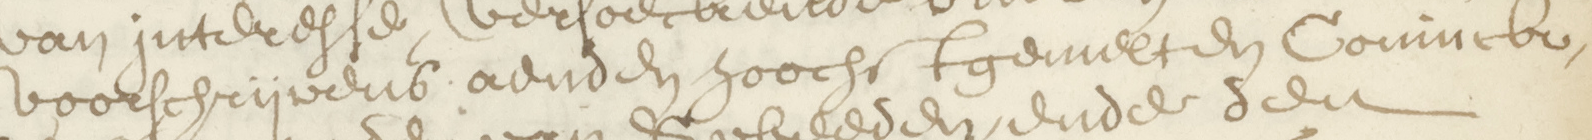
voorschrijvens aenden hoochstgemelten Coninck,
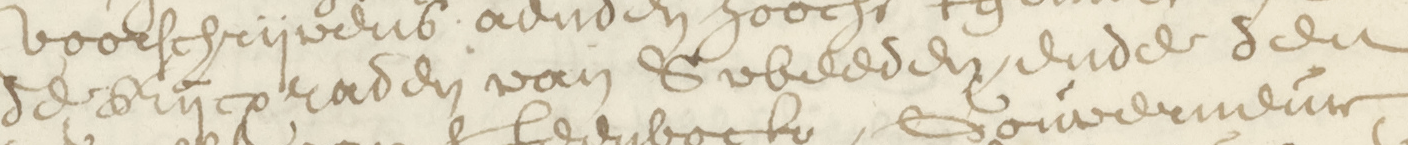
de Rijcxraden van Sweeden, ende den
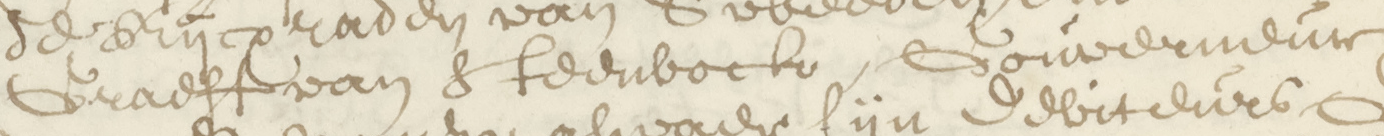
Graeff van Steenbock, Gouverneur
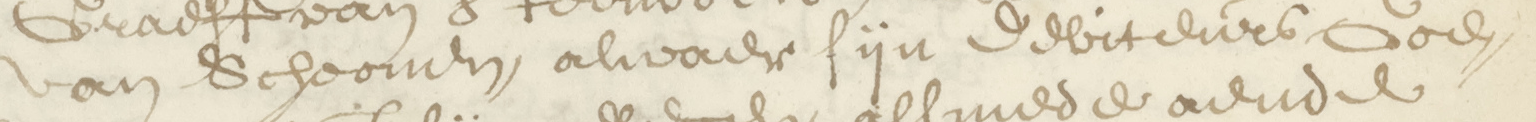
van Schoonen, alwaer sijn Debiteurs Goe„
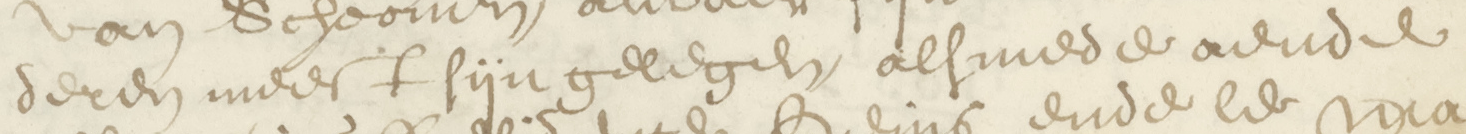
deren meest sijn gelegen, alsmede aende
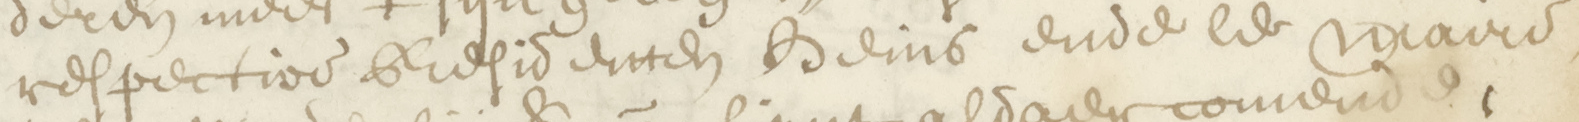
respective Residenten Heins ende le Maire
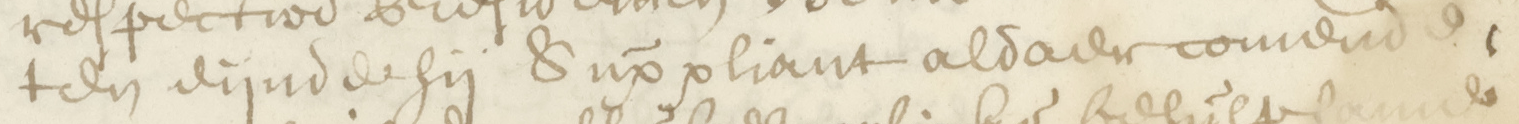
ten eijnde hij Suppliant aldaer comende,
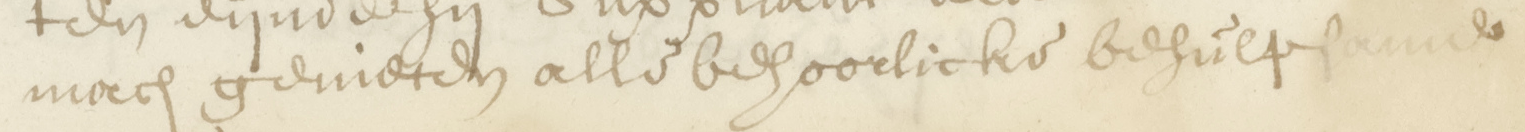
mach genieten alle behoorlicke behulpsame
